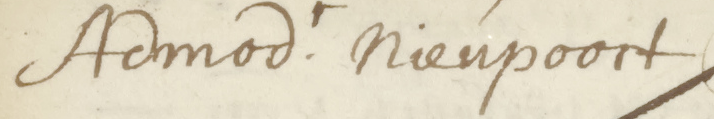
Admodr: Nieupoort
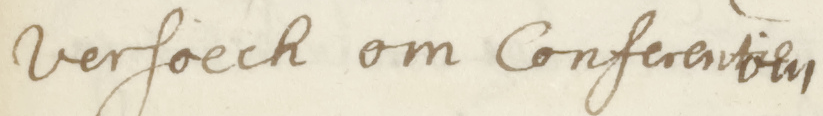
versoeck om conferentie
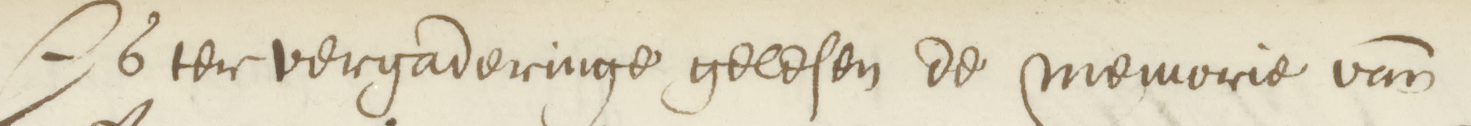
Is ter vergaderinge gelesen de memorie van
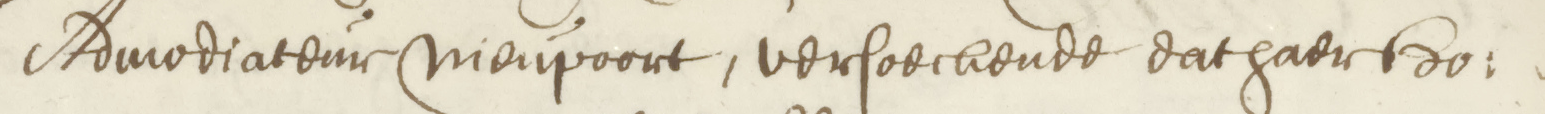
Admodiateur Nieupoort, versoeckende dat haer Ho:
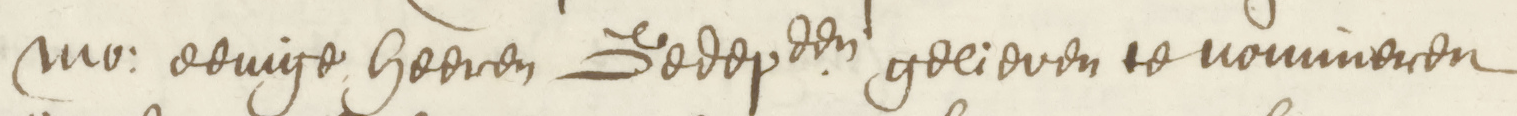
mo: eenige heeren Gedepden gelieven te nomineren
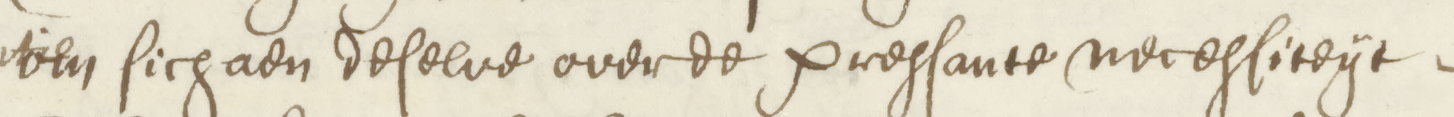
om sich aen deselve over de pressante necessiteijt
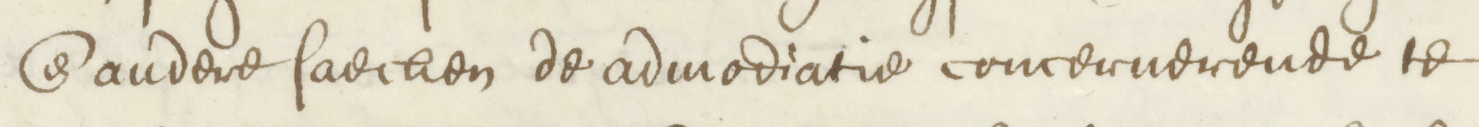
& andere saecken de admodiatie concernerende te
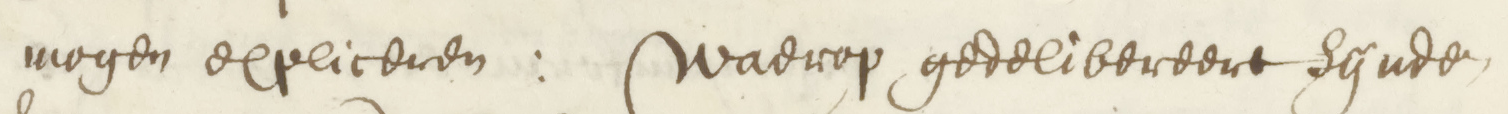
mogen expliceren: Waerop gedelibereert sijnde,
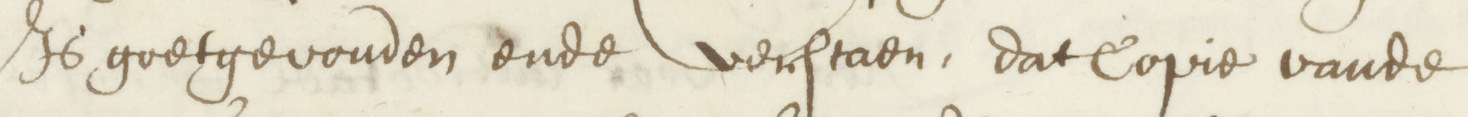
Is goetgevonden ende verstaen, dat copie vande
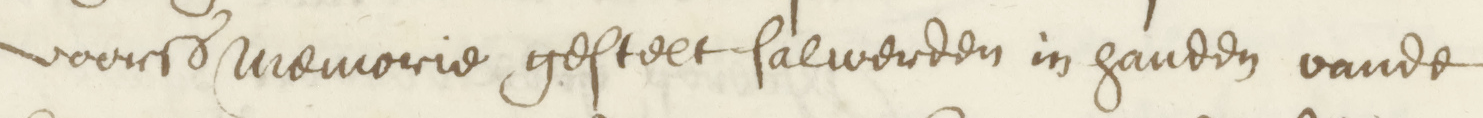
voors memorie gestelt sal werden in handen vande
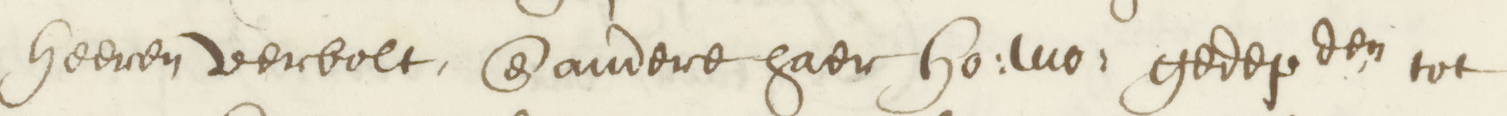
heeren Verbolt, & andere haer Ho:mo gedepden tot
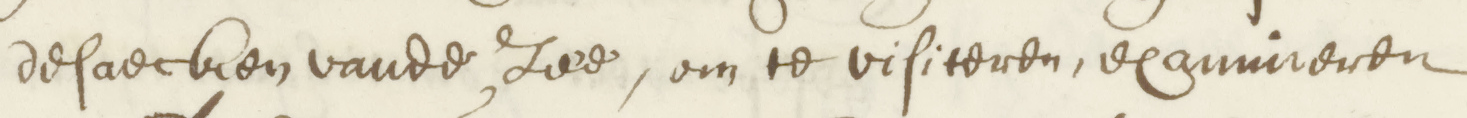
de saecken vande Zee, om te visiteren, examineren
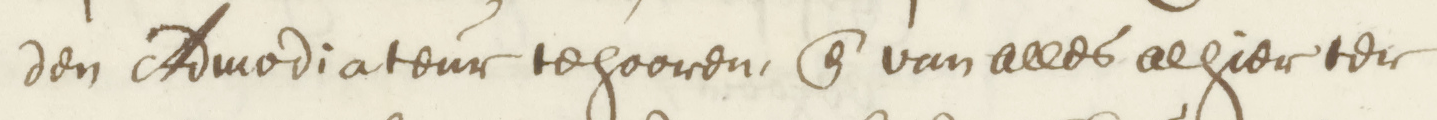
den Admodiateur te hooren, & van alles alhier ter
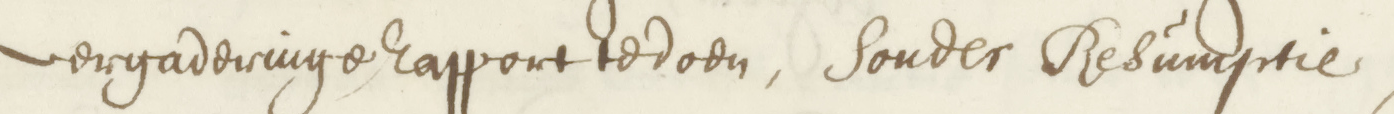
vergaderinge rapport te doen, sonder resumptie.
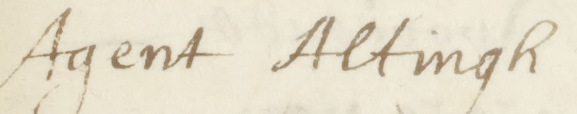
Agent Altingh
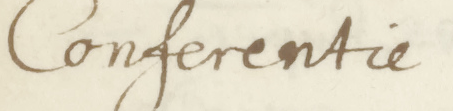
Conferentie
